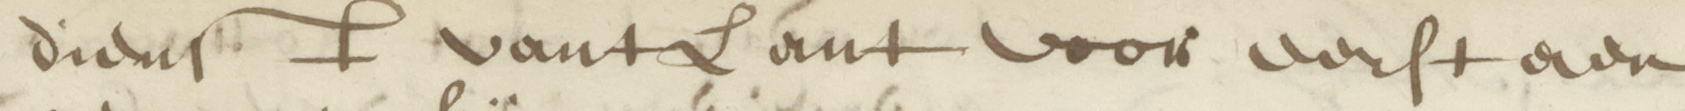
dienst vant Lant voor eerst aen
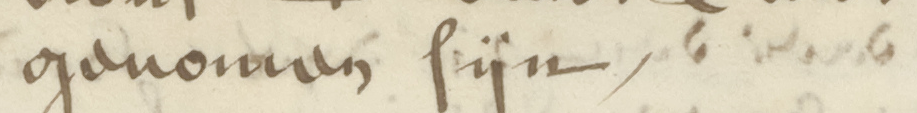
genomen sijn.
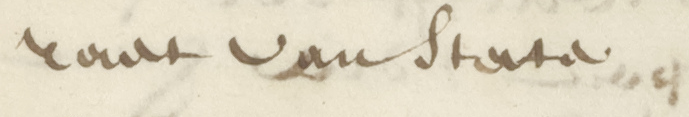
raet van State,
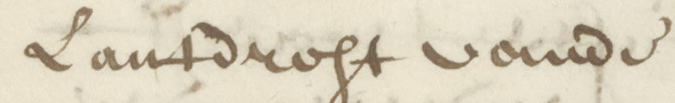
Lantdrost vande
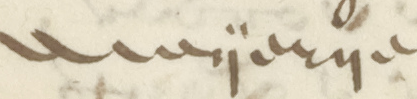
Meijerye
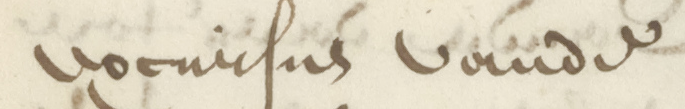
excursien vande
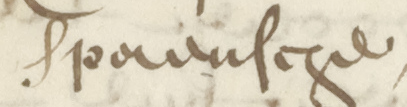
Spaensche,
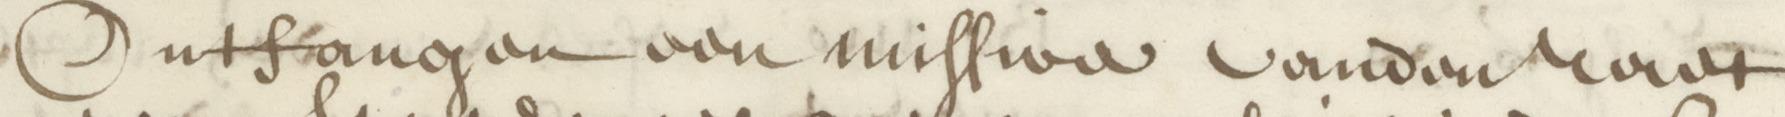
Ontfangen een missive vanden Raet
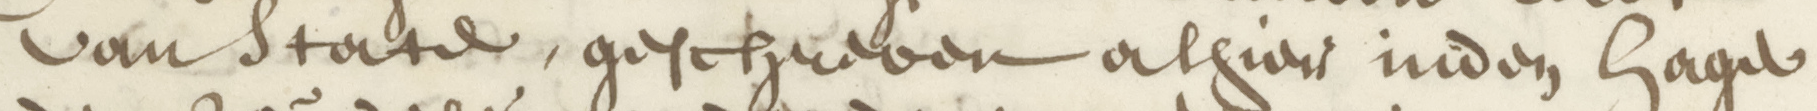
van State, geschreven alhier inden Hage
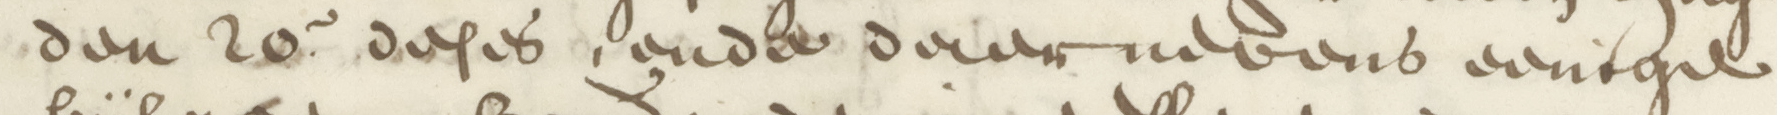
den 20e. deses, ende daernevens eenige
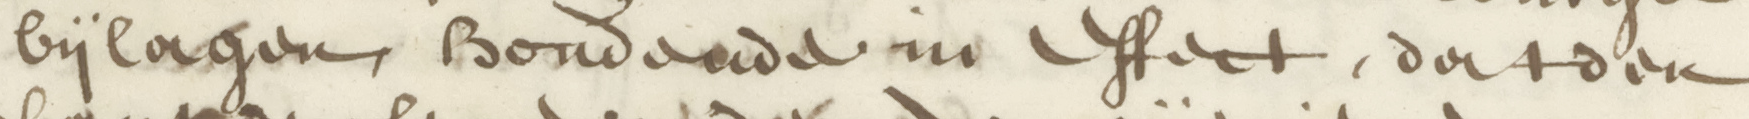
bijlagen, houdende in effect, dat den
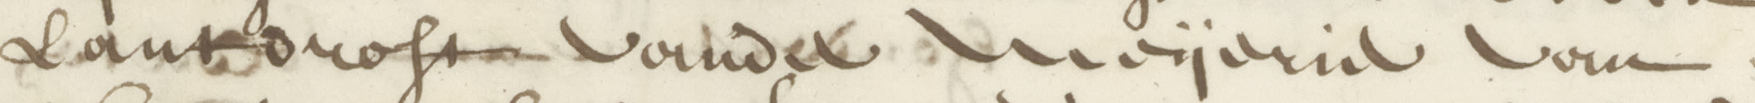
Lantdrost vande Meijerie van
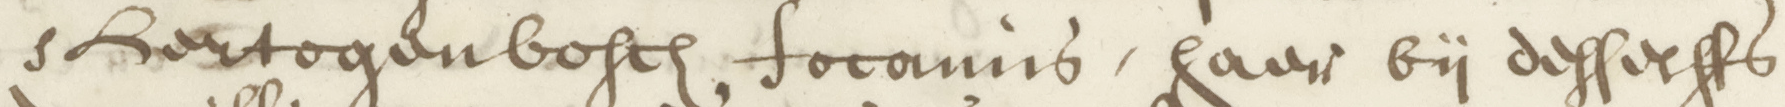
sHertogenbosch Focanus, haer bij desselffs
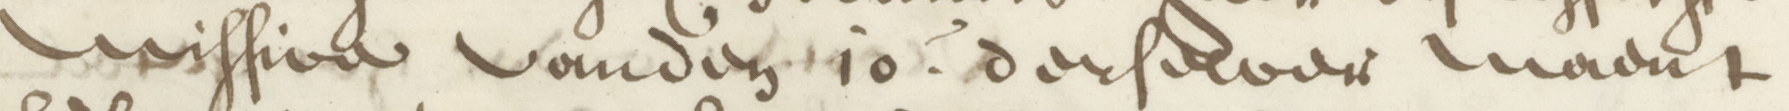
Missive vanden 10e. derselver maent
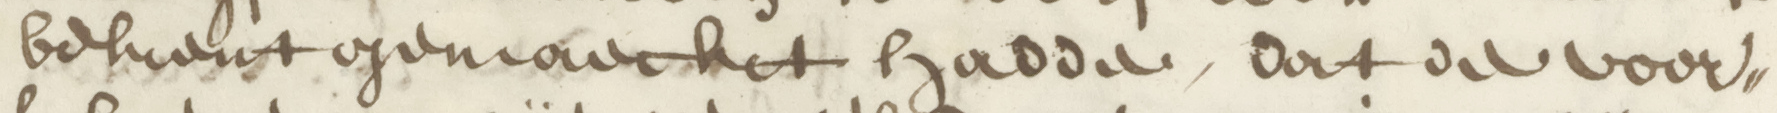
bekent gemaeckt hadde, dat de voor„
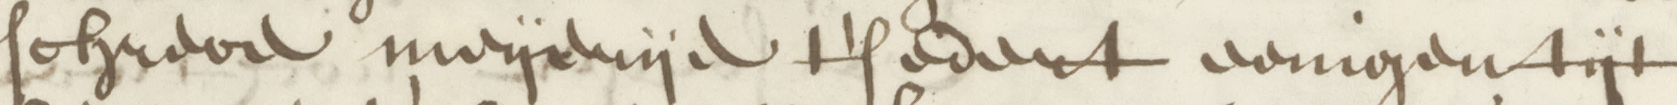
„schreve meijerije t'sedert eenigen tijt
